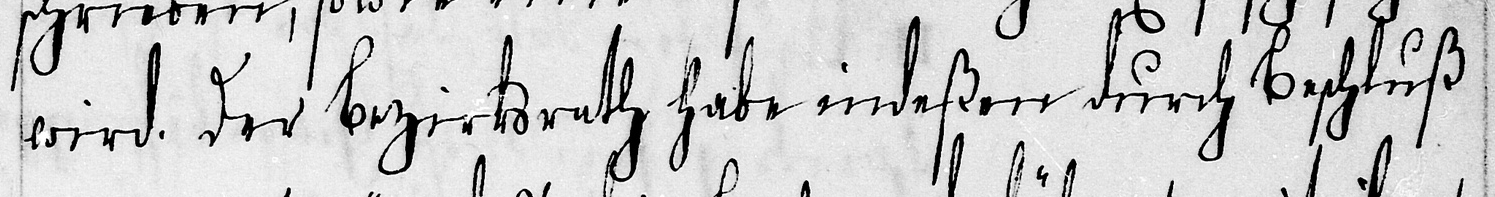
wird. Der Bezirksrath habe indeßen durch Beschluß
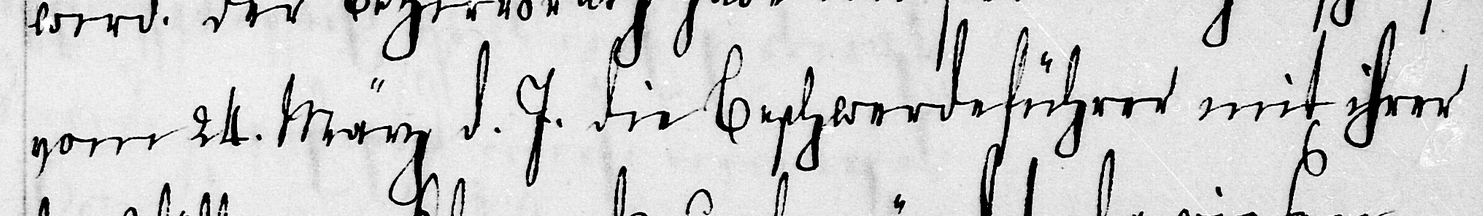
vom 24. März d. J. die Beschwerdeführer mit ihrer
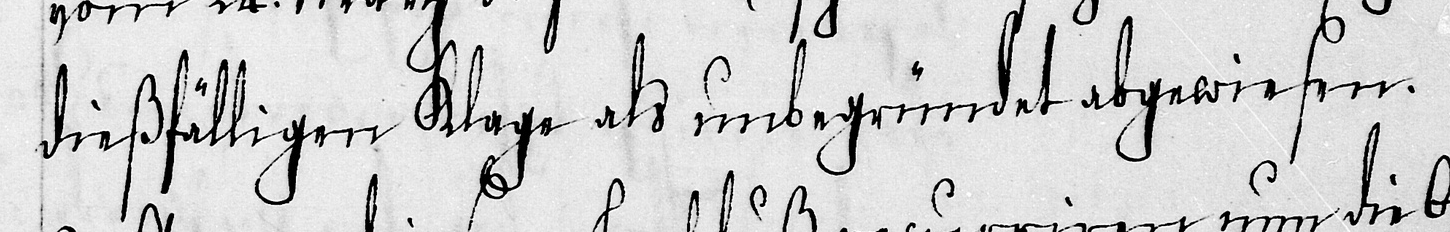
dießfälligen Klage als unbegründet abgewiesen.
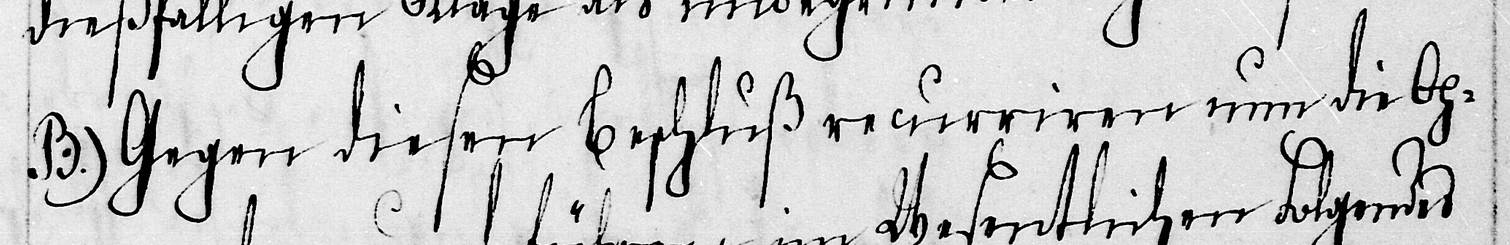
B.) Gegen diesen Beschluß recurriren nun die Op¬
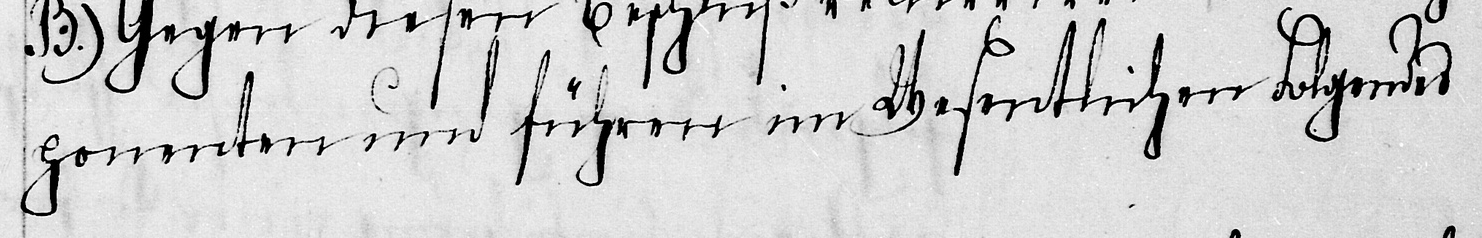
ponenten und führen im Wesentlichen Folgendes
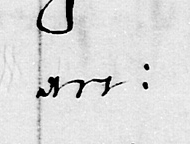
an:
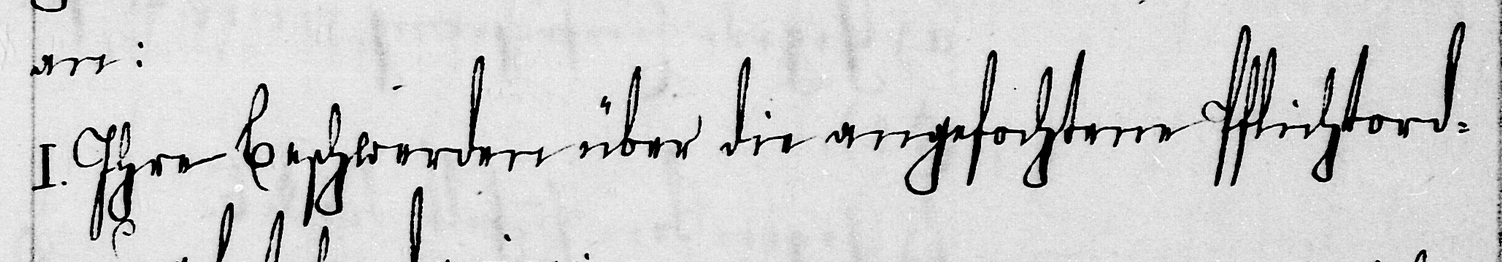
I. Ihre Beschwerden über die angefochtene Pflichtord¬
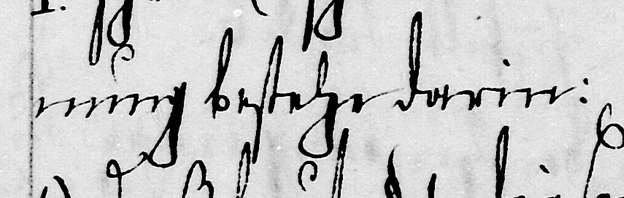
nung bestehe darin:
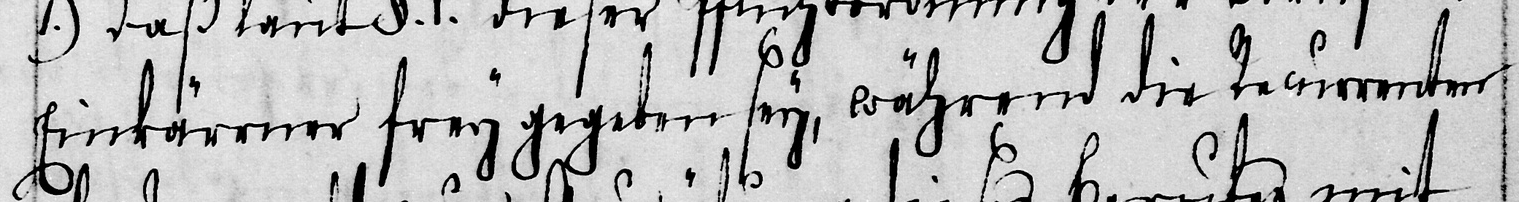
Einkärrner frey gegeben sey, während die Recurrenten
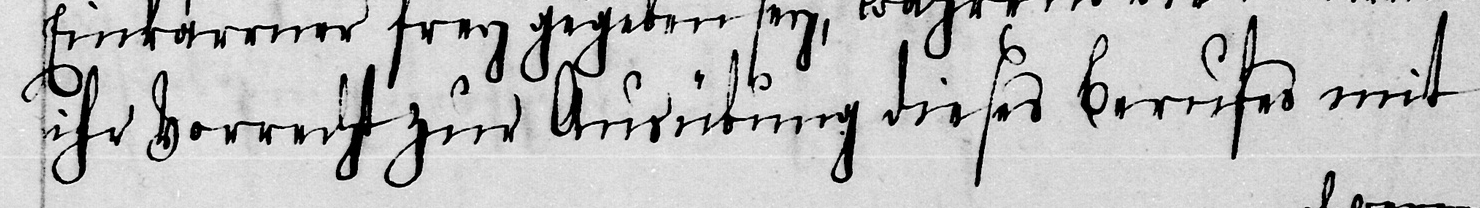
ihr Vorrecht zur Ausübung dieses Berufes mit
